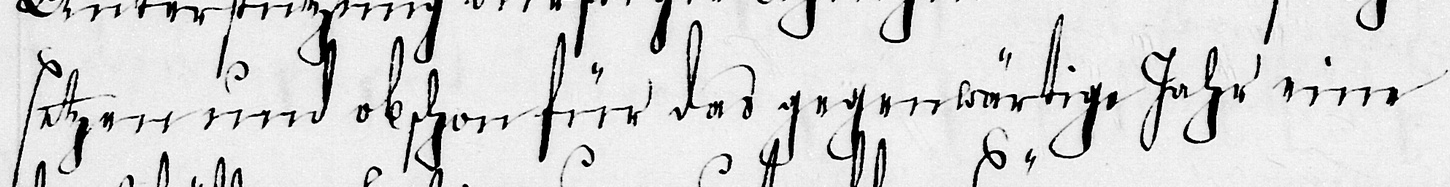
setzen und obschon für das gegenwärtige Jahr eine
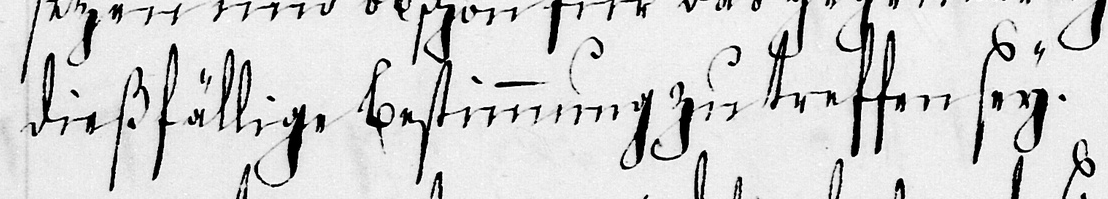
dießfällige Bestimmung zu treffen sey.
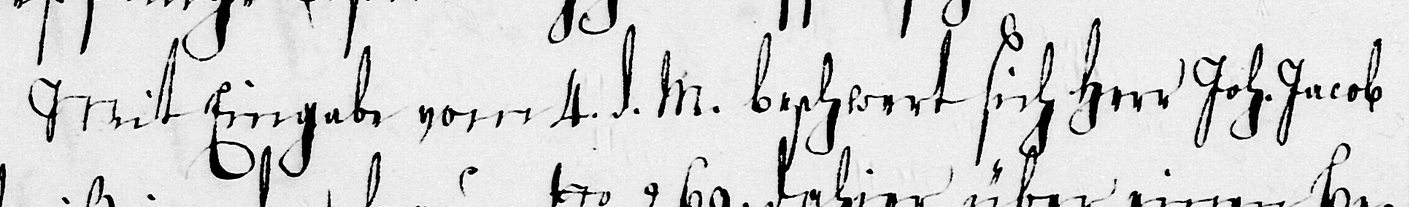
Mit Eingabe vom 4. d. M. beschwert sich Herr Joh. Jacob
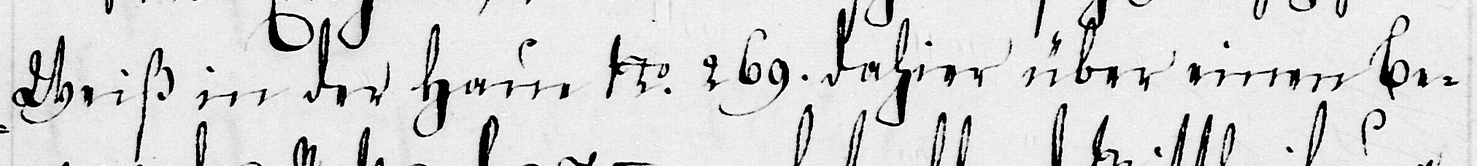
Weiß in der Haue No. 269. dahier über einen Bes¬
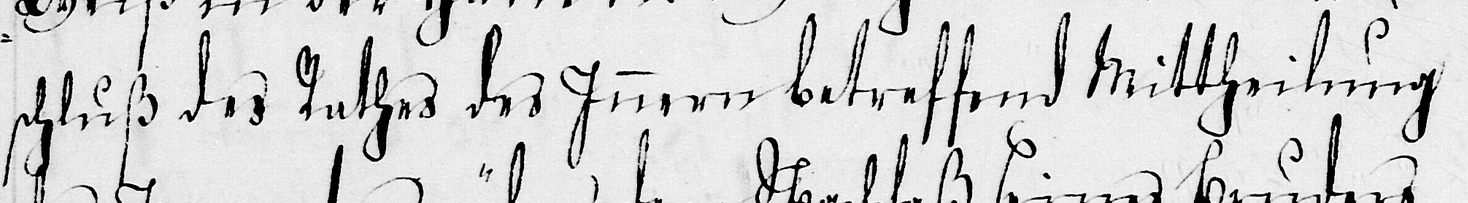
chluß des Rathes des Innern betreffend Mittheilung
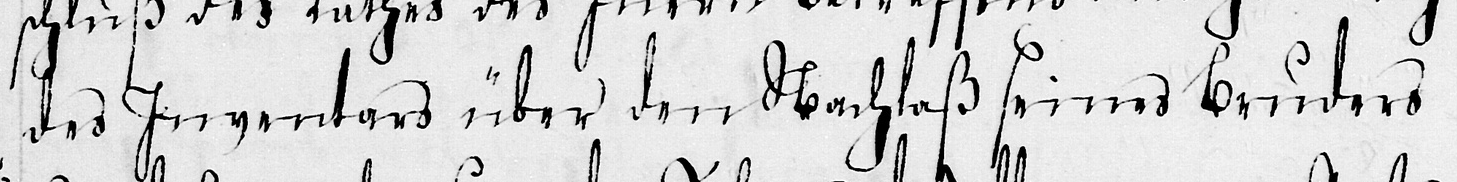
des Inventars über den Nachlaß seines Bruders
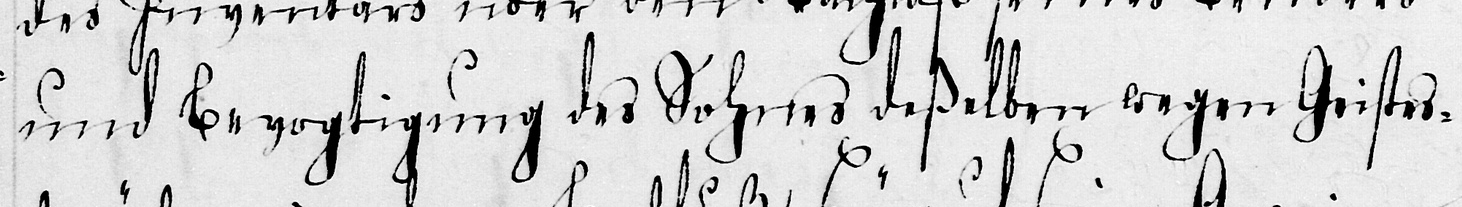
und Bevogtigung des Sohnes deßelben wegen Geistes¬
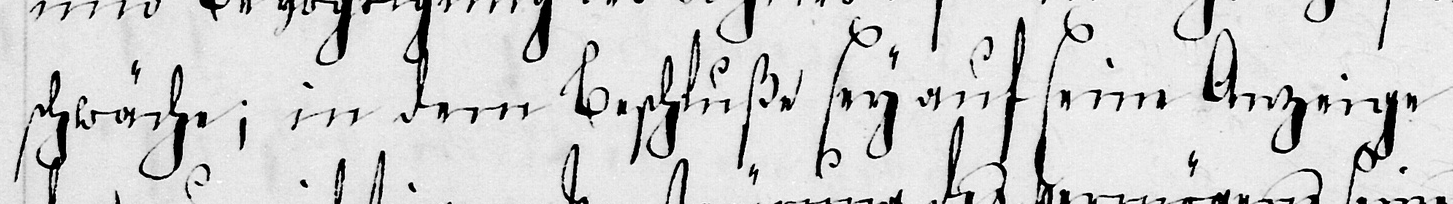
schwäche; in dem Beschluße sey auf seine Anzeige
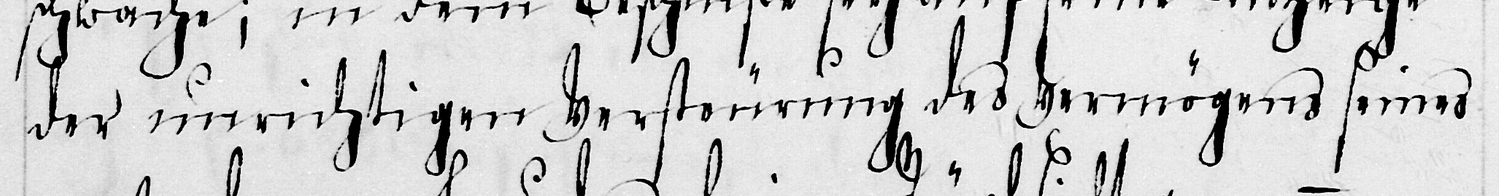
der unrichtigen Versteurung des Vermögens seines
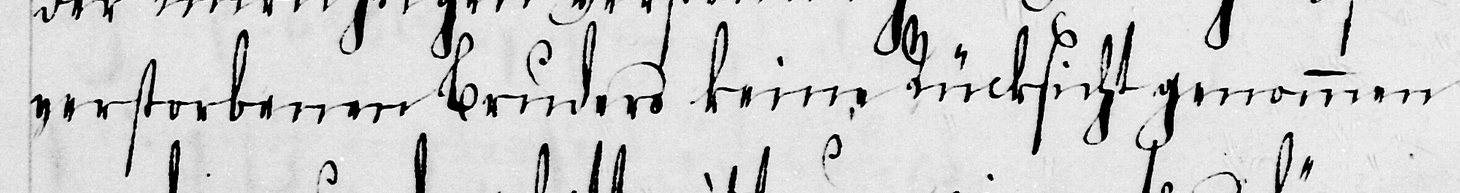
verstorbenen Bruders keine Rücksicht genommen
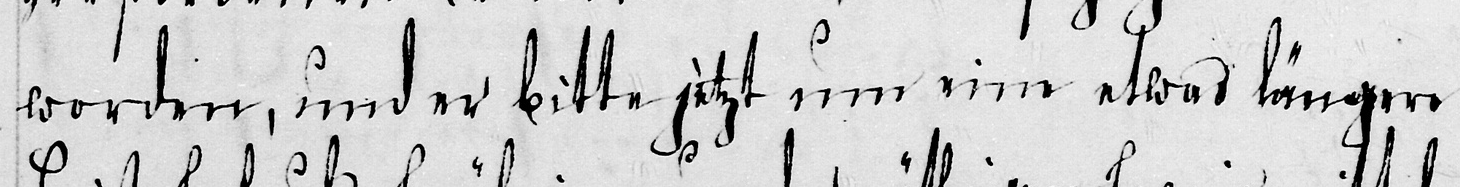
worden, und er bitte jetzt um eine etwas längere
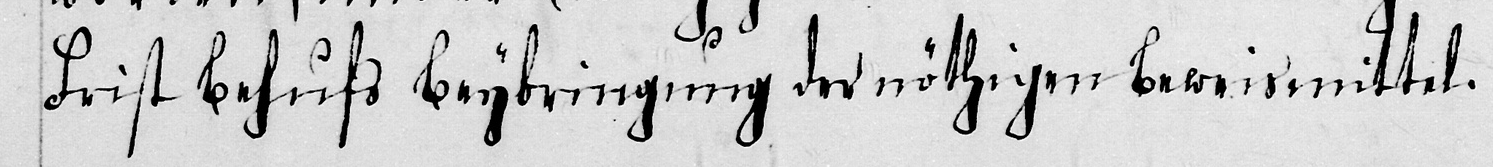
Frist behufs Beybringung der nöthigen Beweismittel.
